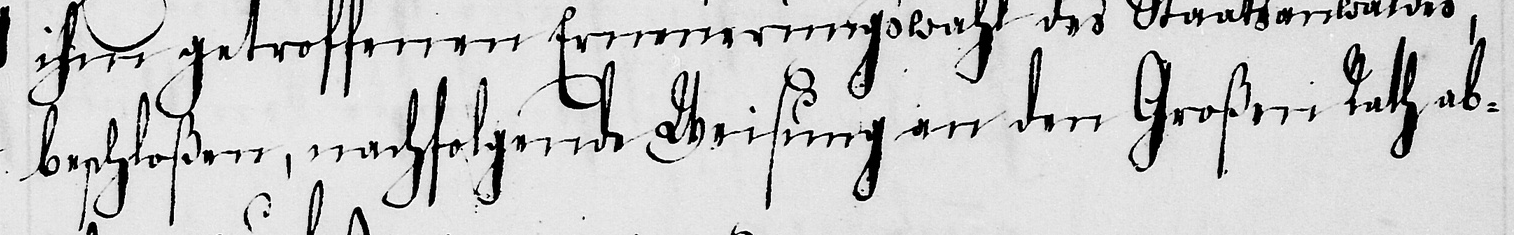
beschloßen, nachfolgende Weisung an den Großen Rath ab¬
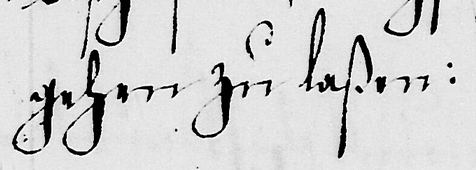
gehen zu laßen:
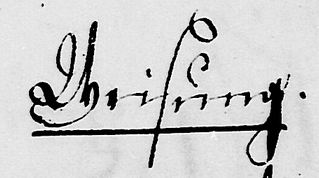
Weisung.
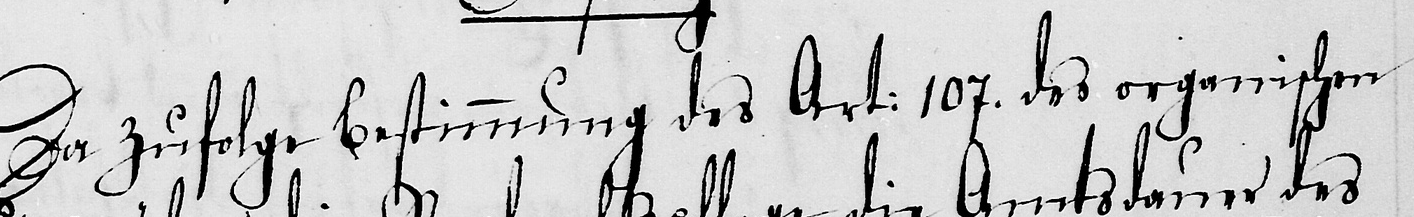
Da zufolge Bestimmung des Art: 107. des organischen
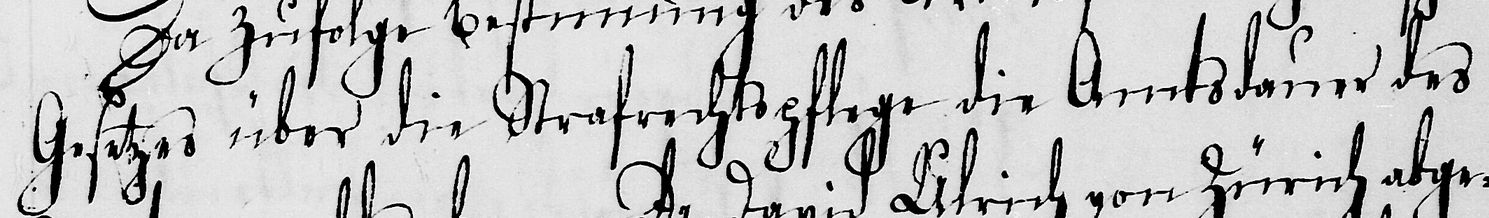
Gesetzes über die Strafrechtspflege die Amtsdauer des
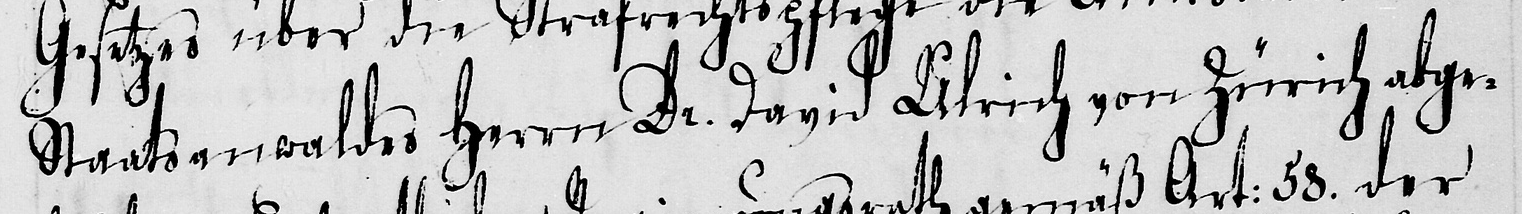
Staatsanwaldes Herrn Dr. David Ulrich von Zürich abge¬
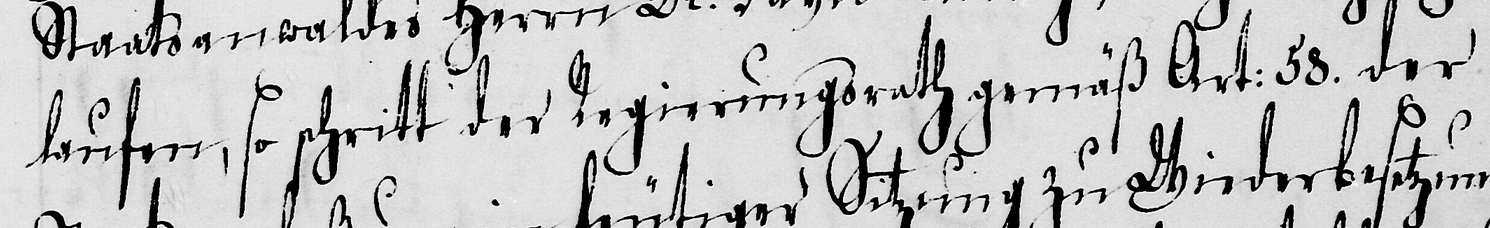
laufen, so schritt der Regierungsrath gemäß Art: 58. der
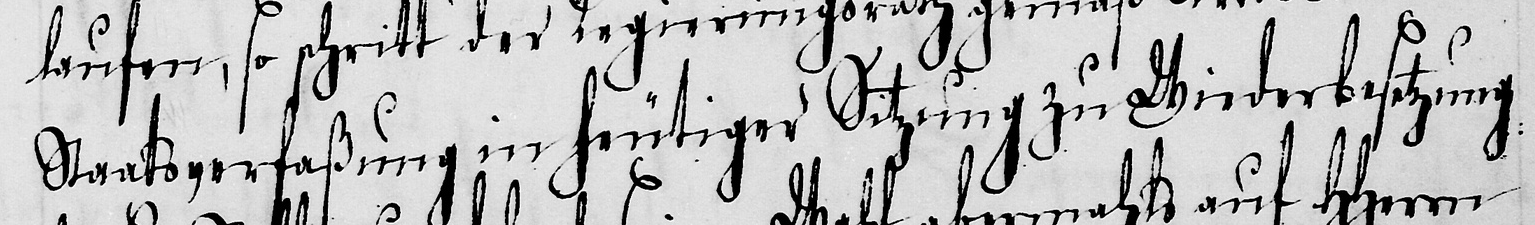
Staatsverfaßung in heutiger Sitzung zu Wiederbesetzung
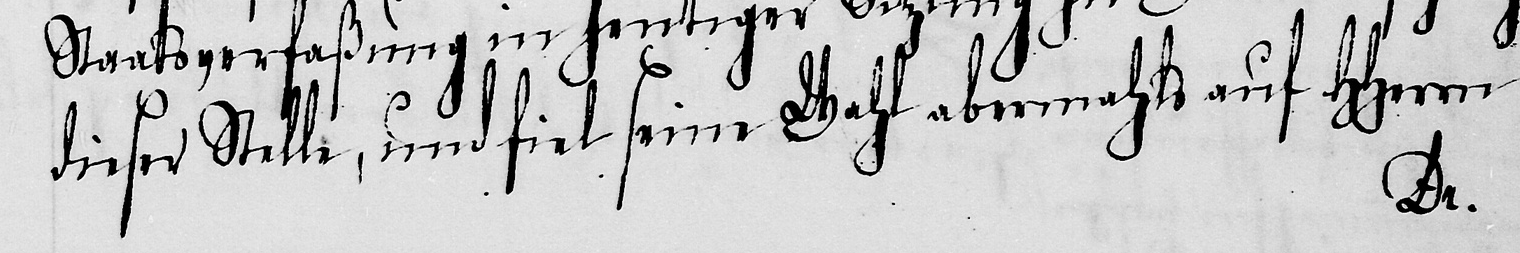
ieser Stelle, und fiel seine Wahl abermahls auf HHerrn
